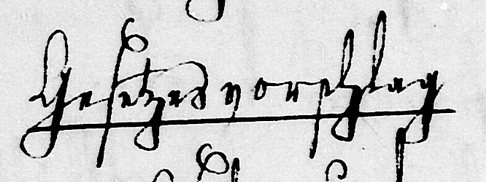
Gesetzesvorschlag
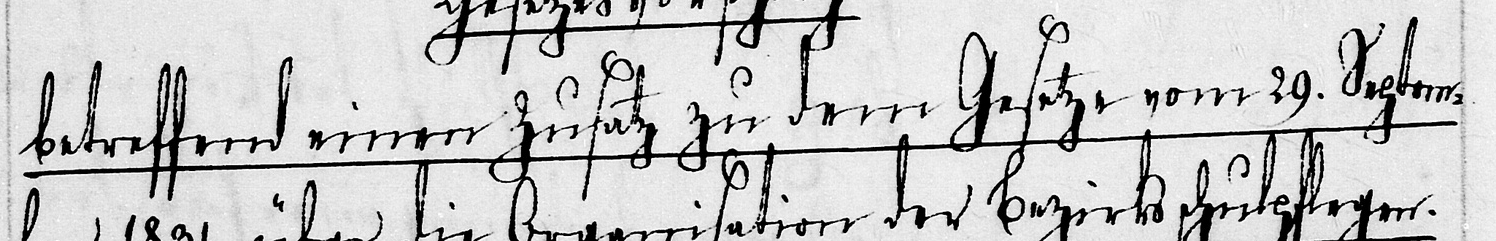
betreffend einen Zusatz zu dem Gesetze vom 29. Septem¬
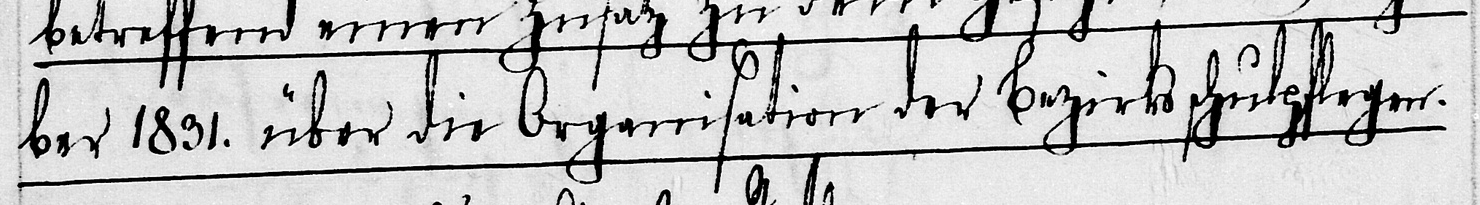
ber 1831. über die Organisation der Bezirksschulpflegen.
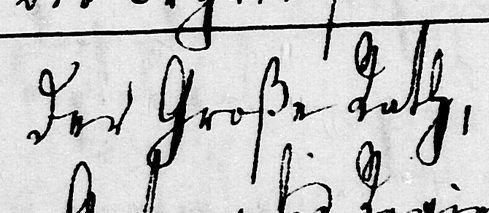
Der Große Rath,
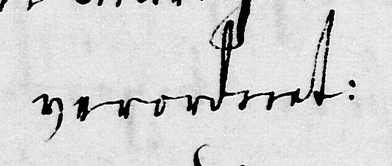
verordnet:
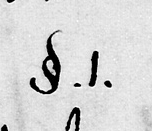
§. 1.
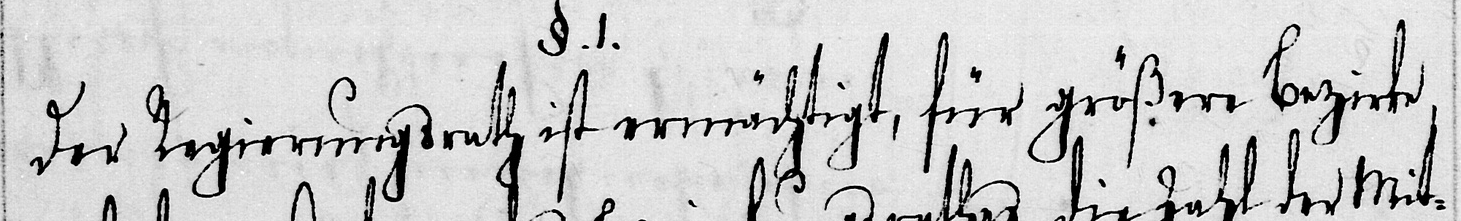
Der Regierungsrath ist ermächtigt, für größere Bezirke
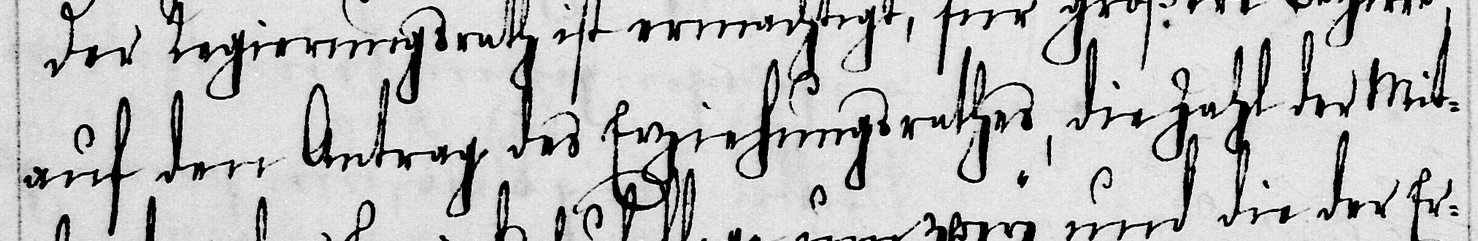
auf den Antrag des Erziehungsrathes, die Zahl der Mit¬
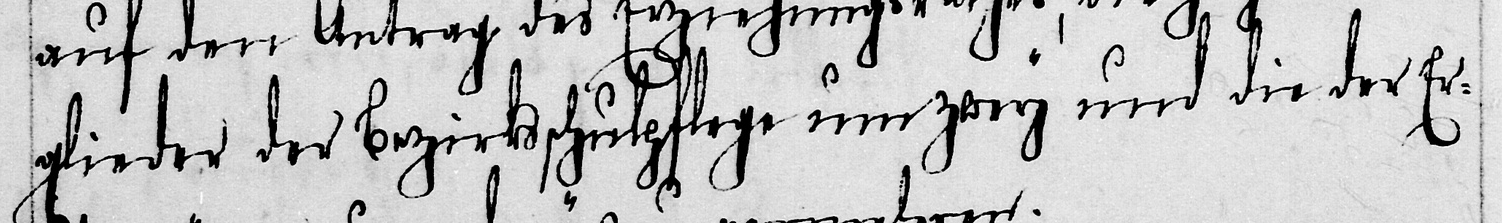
glieder der Bezirksschulpflege um zwey und die der Er¬
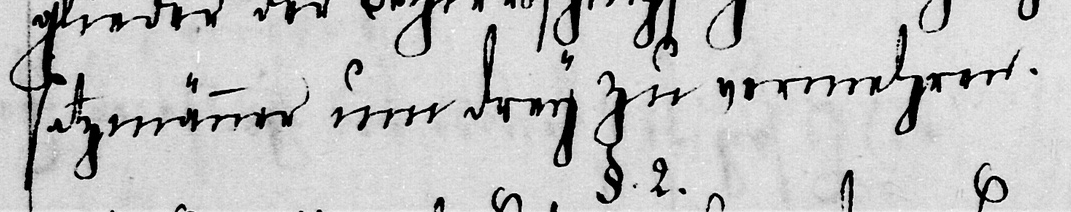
satzmänner um drey zu vermehren.
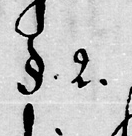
§. 2.
